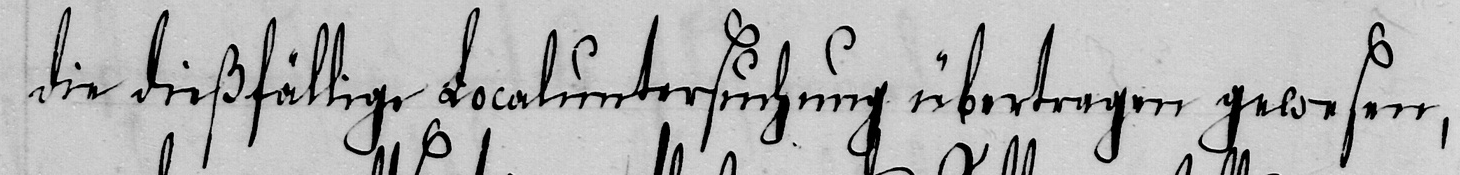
die dießfällige Localuntersuchung übertragen gewesen,
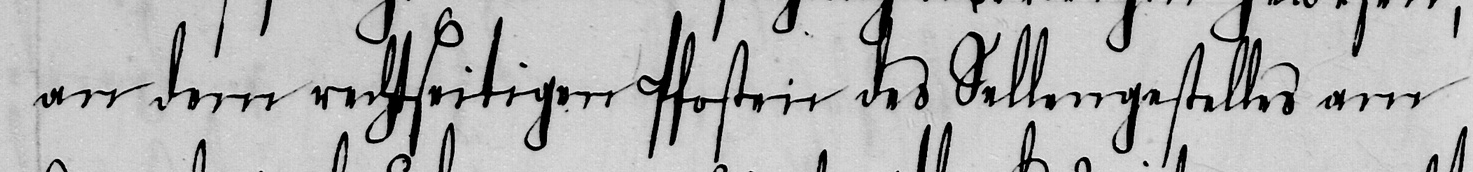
an dem rechtseitigen Pfosten des Sellengestelles am
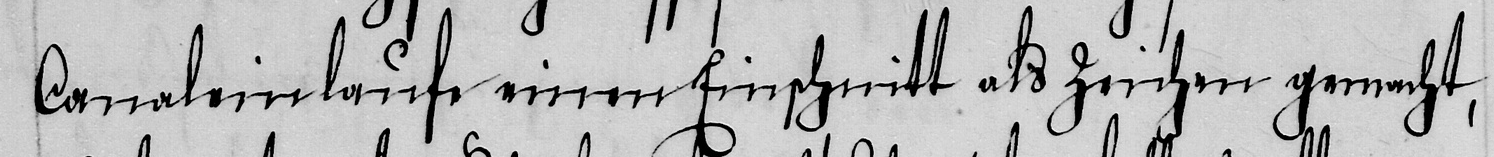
Canaleinlaufe einen Einschnitt als Zeichen gemacht,
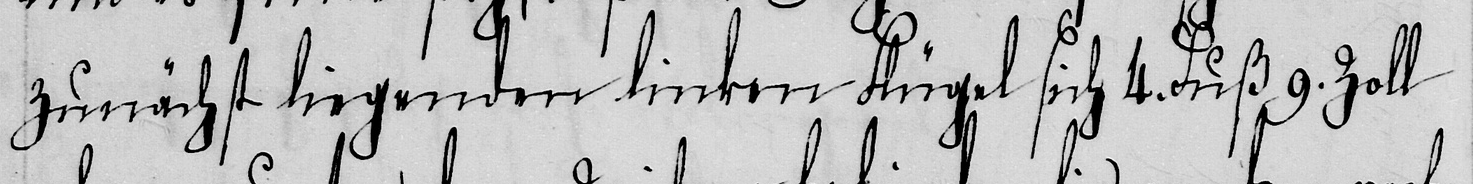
zunächst liegenden linken Flügel sich 4. Fuß 9. Zoll
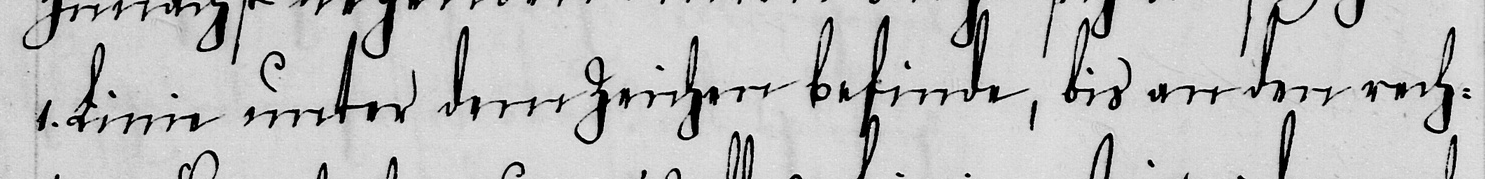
1. Linie unter dem Zeichen befinde, bis an den rech¬
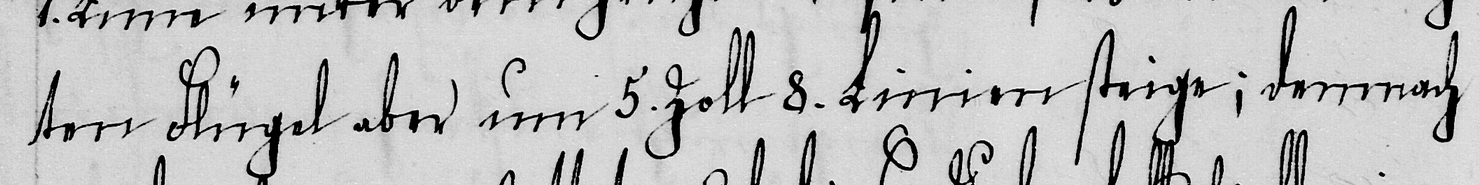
ten Flügel aber um 5. Zoll 8.Linien steige; demnach
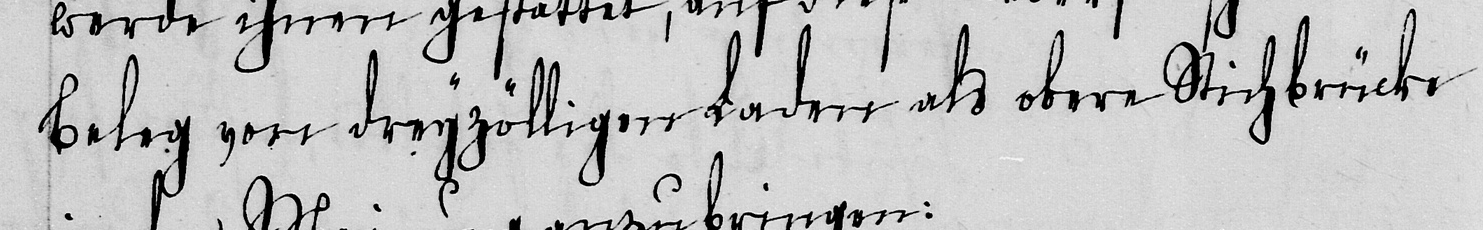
Beleg von dreyzölligen Laden als obere Stichbrücke
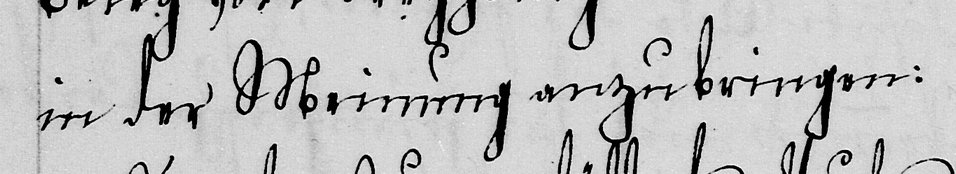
in der Meinung anzubringen:
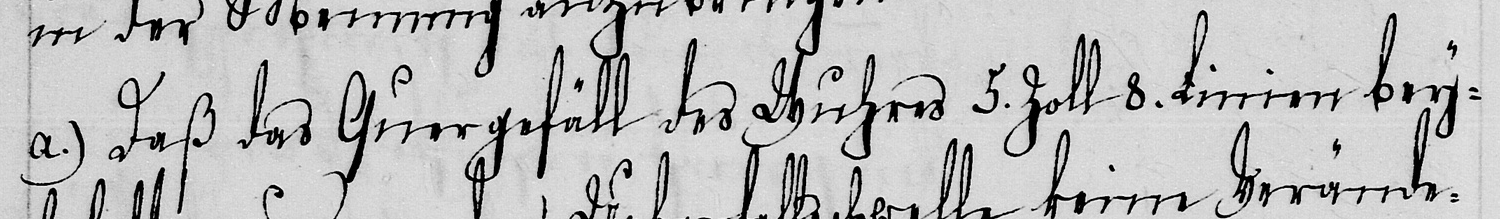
a.) Daß das Quergefäll des Wuhres 5. Zoll 8. Linien bey¬
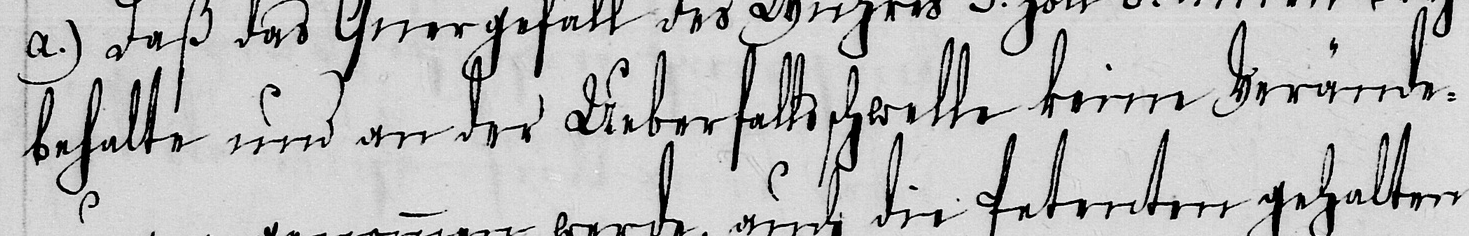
behalte und an der Ueberfallsschwelle keine Verände¬
